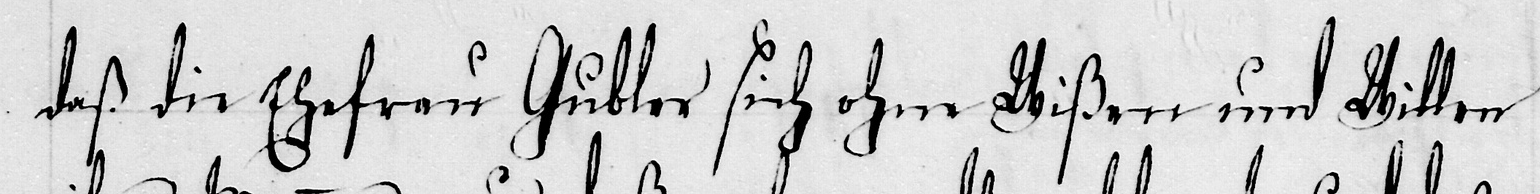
daß die Ehefrau Gubler sich ohne Wißen und Willen
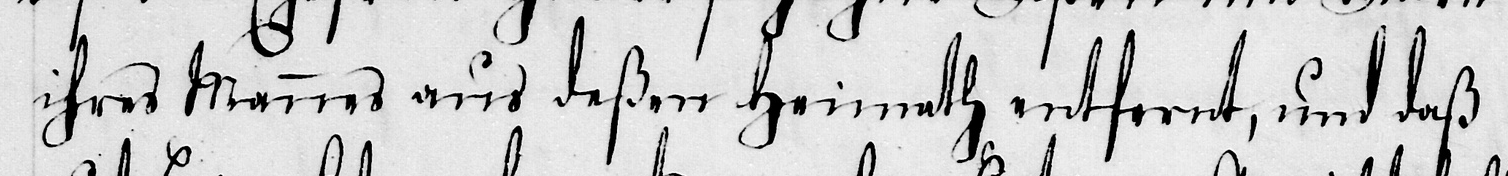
ihres Mannes aus deßen Heimath entfernt, und daß
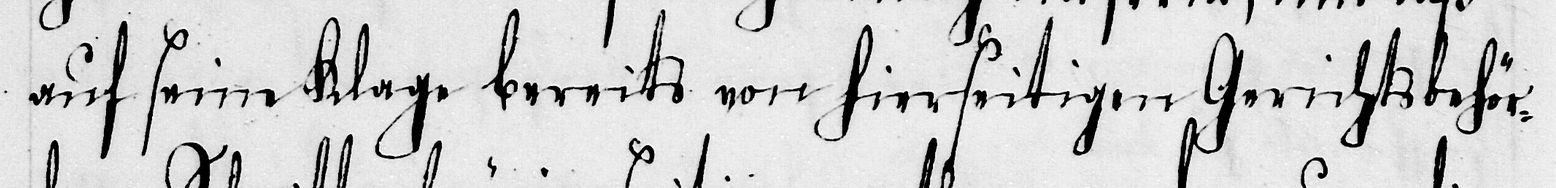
auf seine Klage bereits von hierseitigen Gerichtsbehör¬
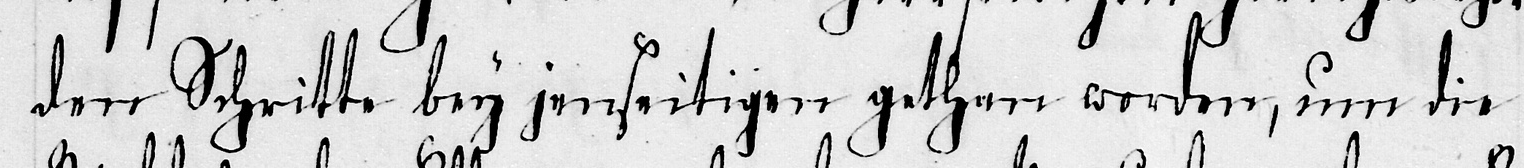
den Schritte bey jenseitigen gethan worden, um die
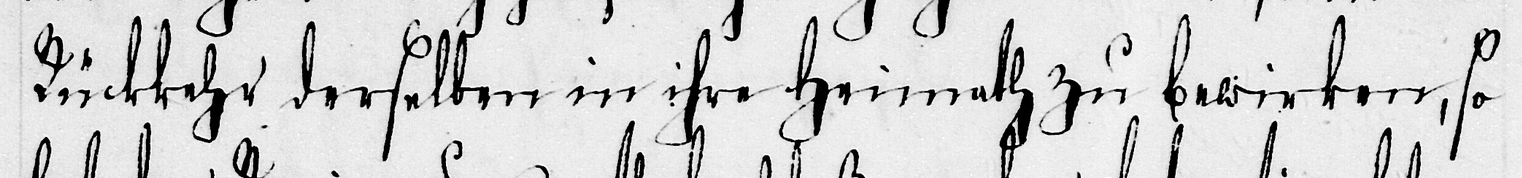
Rückkehr derselben in ihre Heimath zu bewirken, so
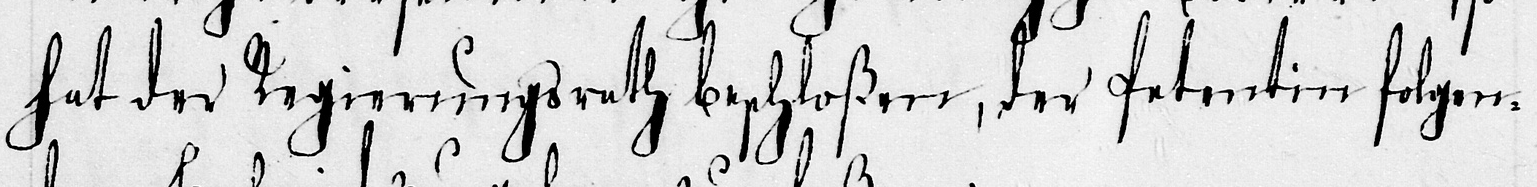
hat der Regierungsrath beschloßen, der Petentin folgen¬
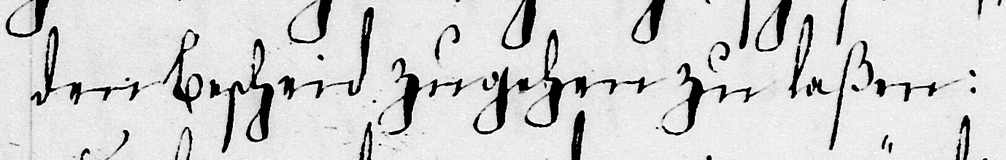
den Bescheid zugehen zu laßen:
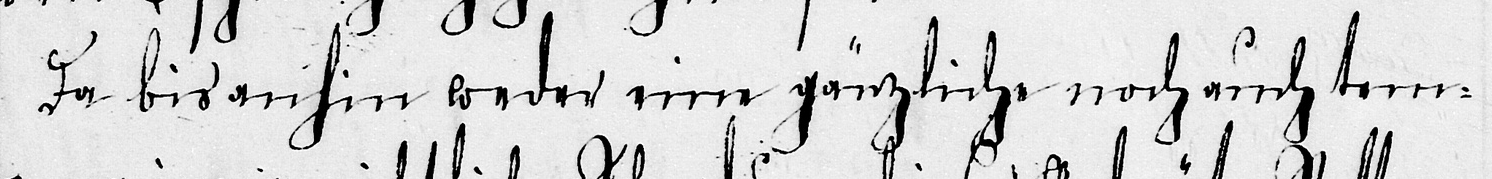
Da bis anhin weder eine gänzliche noch auch tem¬
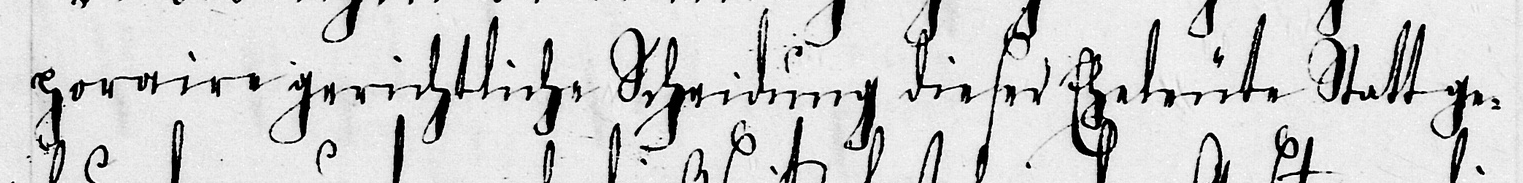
poraire gerichtliche Scheidung dieser Eheleute Statt ge¬
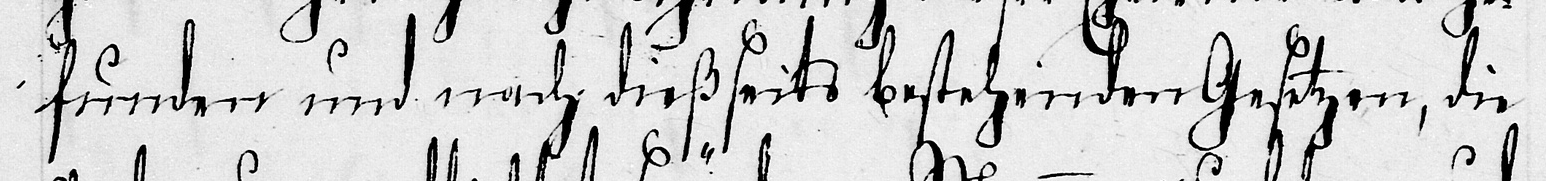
funden und nach dießseits bestehenden Gesetzen, die
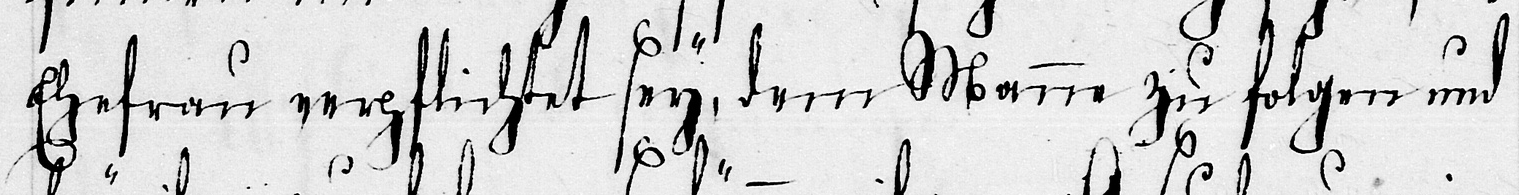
Ehefrau verpflichtet sey, dem Manne zu folgen und
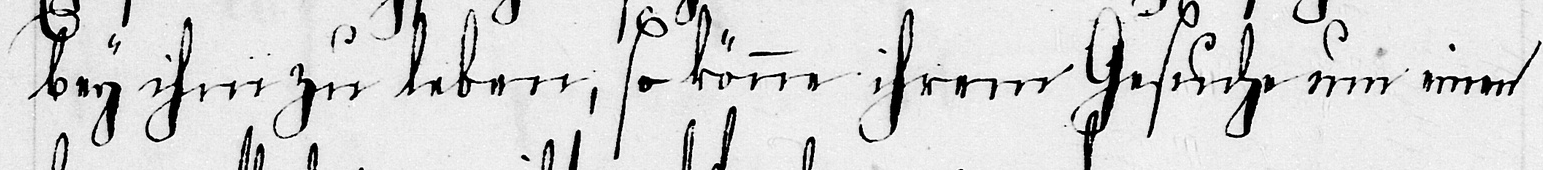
bey ihm zu leben, so könne ihrem Gesuche um einen
